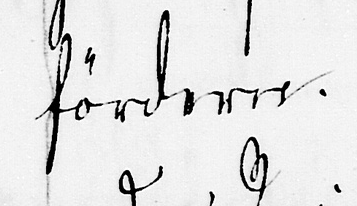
fördern.
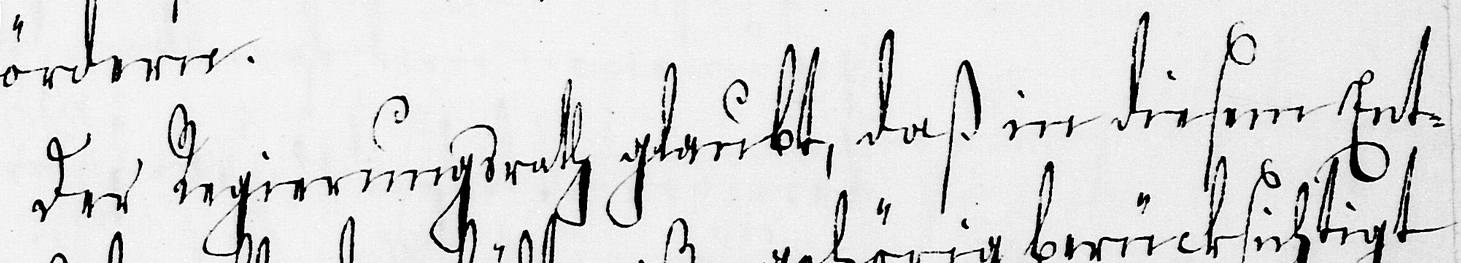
Der Regierungsrath glaubt, daß in diesem Ent¬
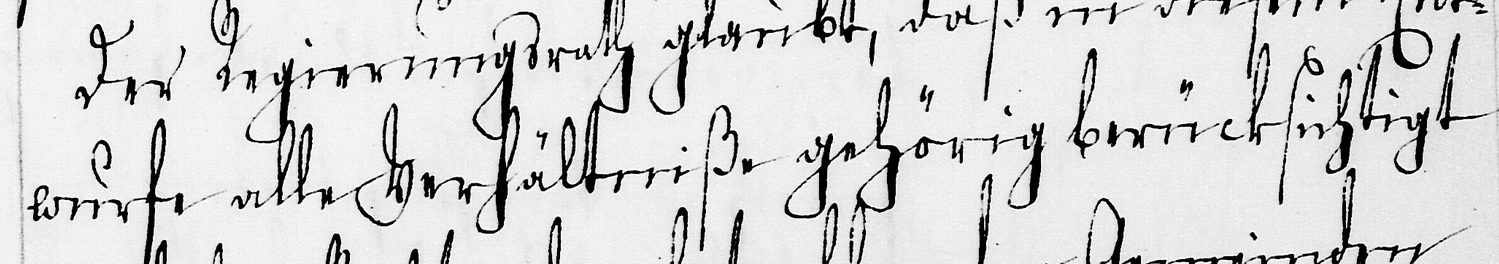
wurfe alle Verhältniße gehörig berücksichtigt
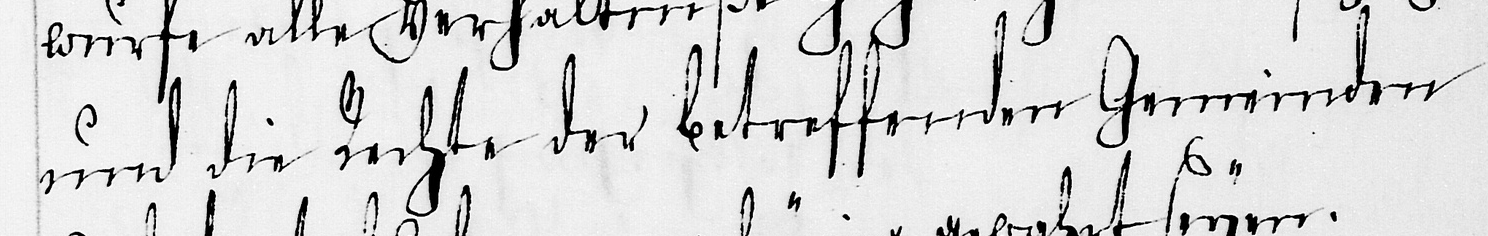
und die Rechte der betreffenden Gemeinden
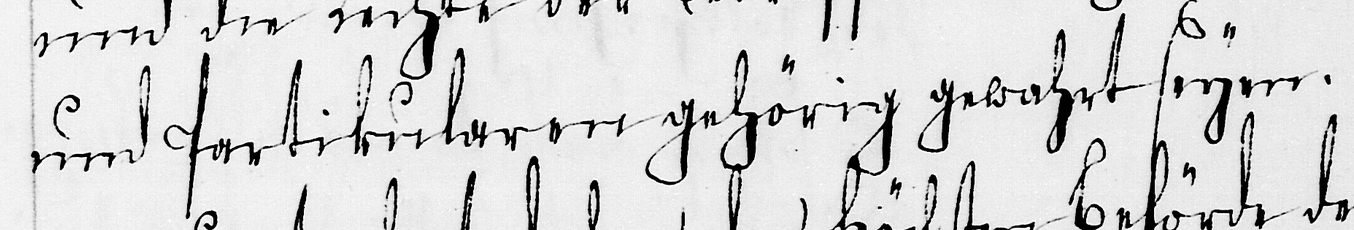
und Partikularen gehörig gewahrt seyen.
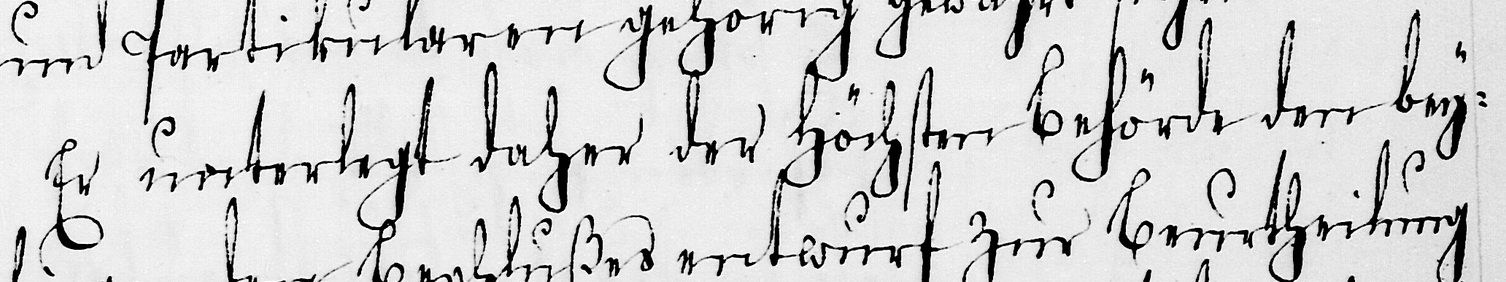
Er unterlegt daher der Höchsten Behörde den bey¬
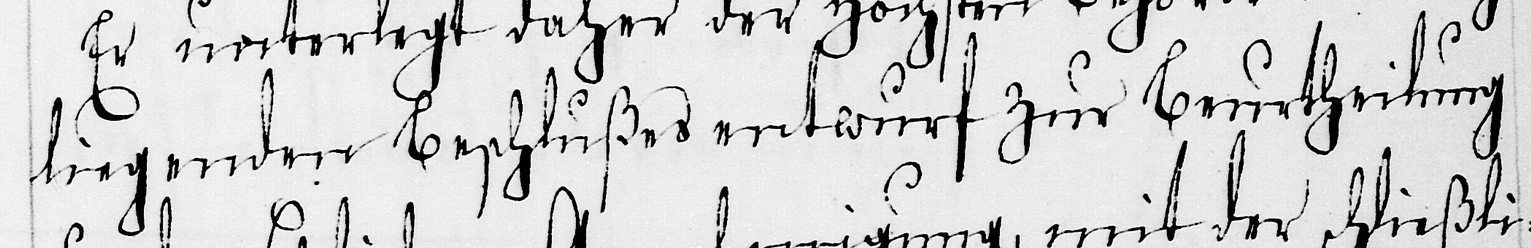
liegenden Beschlußesentwurf zur Beurtheilung
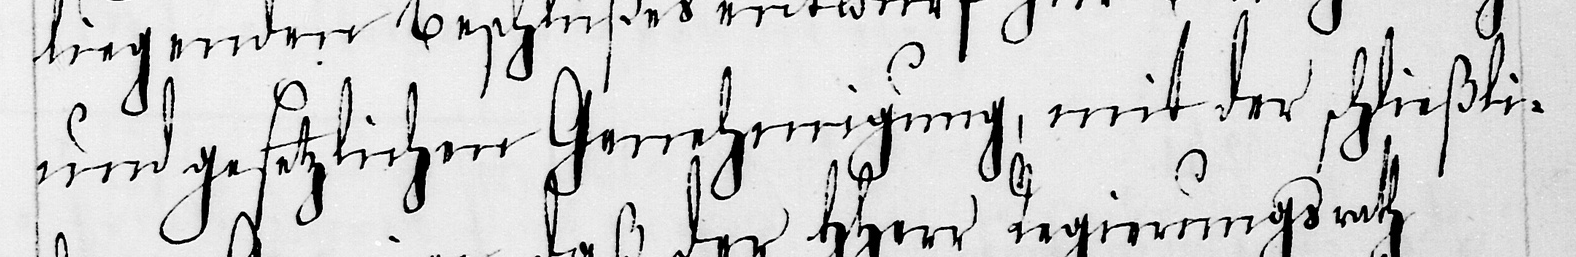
und gesetzlichen Genehmigung, mit der schließli¬
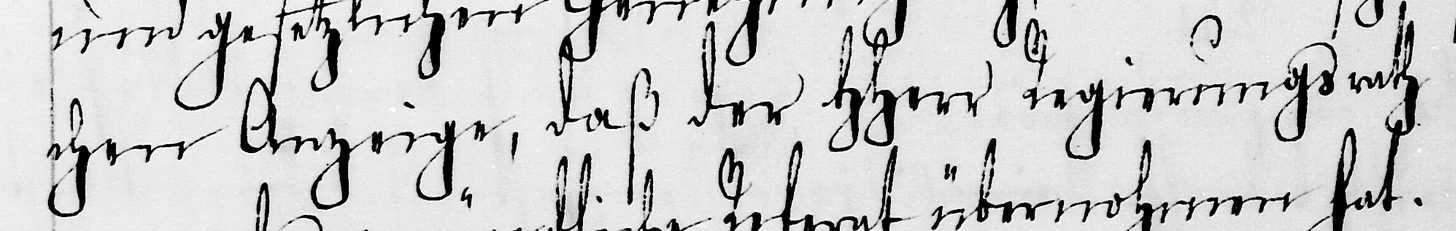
chen Anzeige, daß der HHerr Regierungsrath
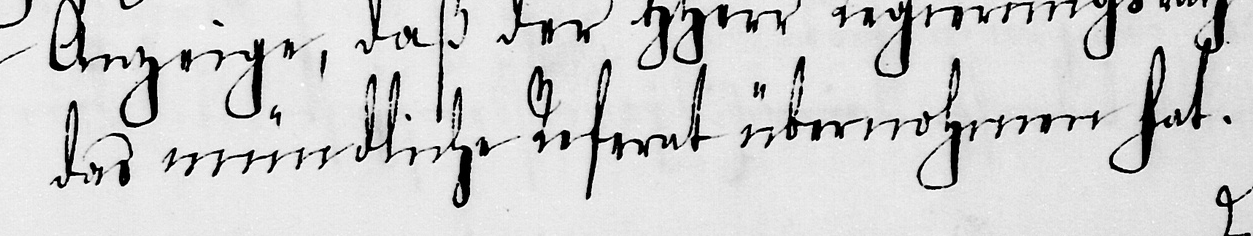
das mündliche Referat übernohmen hat.
